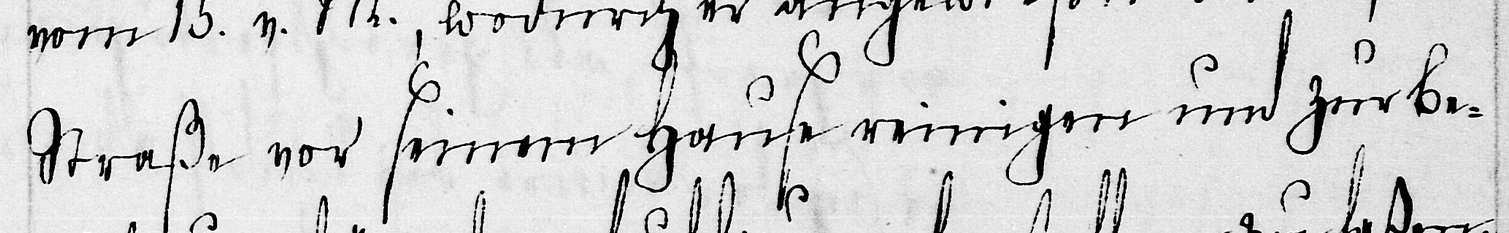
Straße vor seinem Hause reinigen und zur Be¬
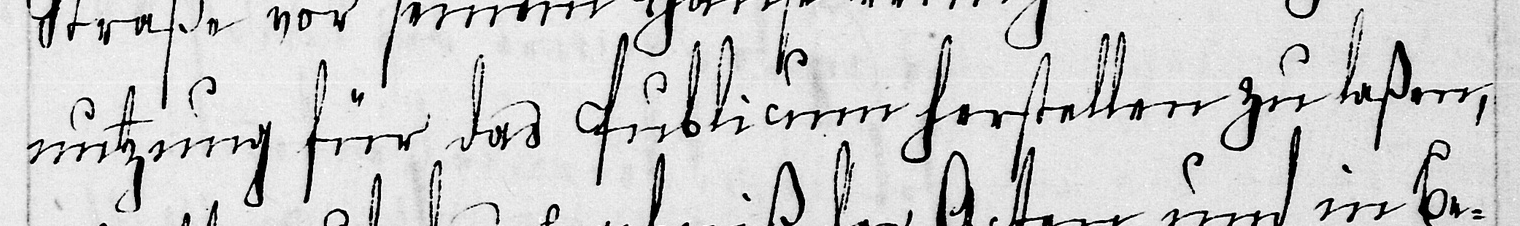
nutzung für das Publicum herstellen zu laßen,
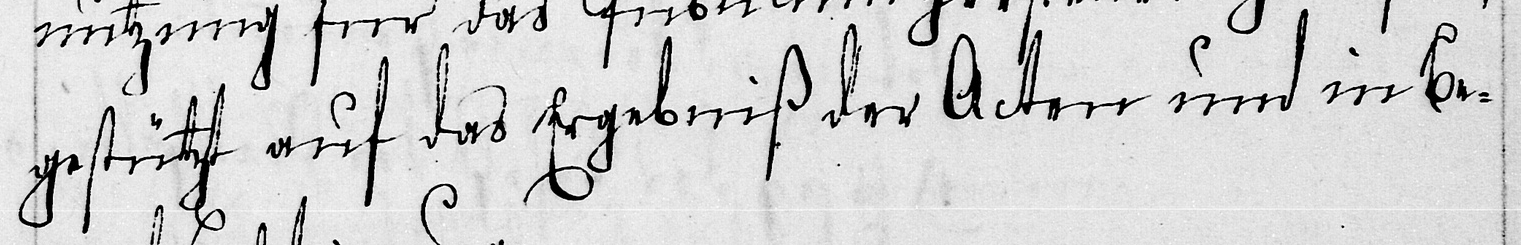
gestützt auf das Ergebniß der Acten und in Be¬
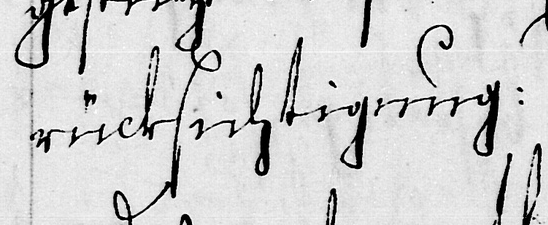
rücksichtigung:
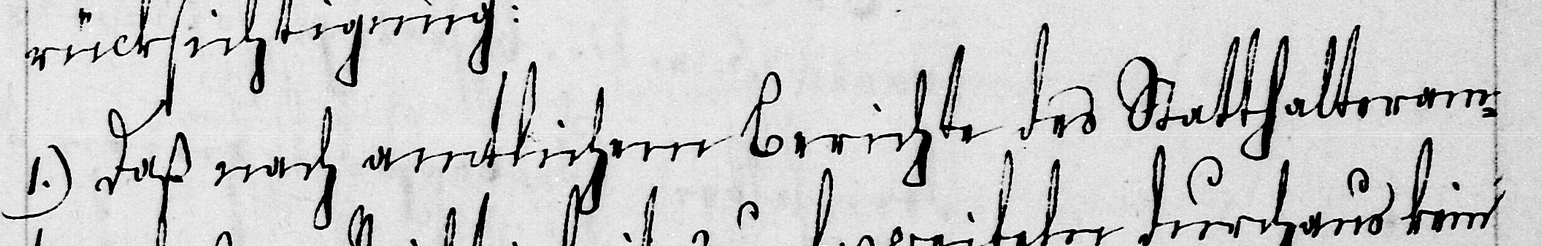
1.) Daß nach amtlichem Berichte des Statthalteram¬
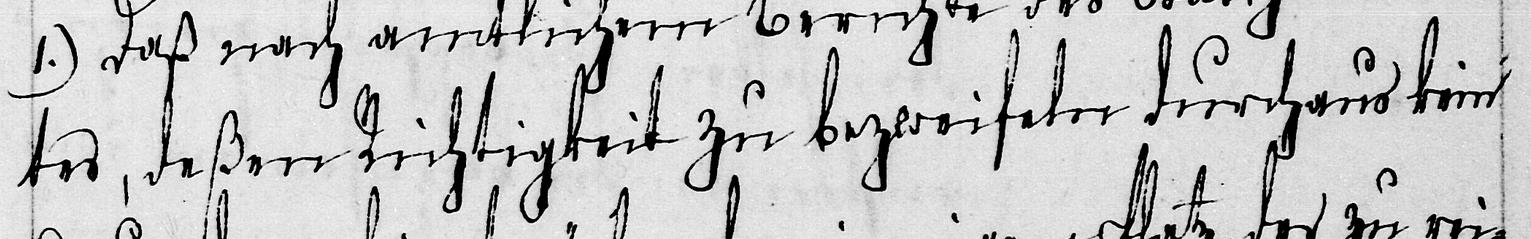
tes, deßen Richtigkeit zu bezweifeln durchaus kein
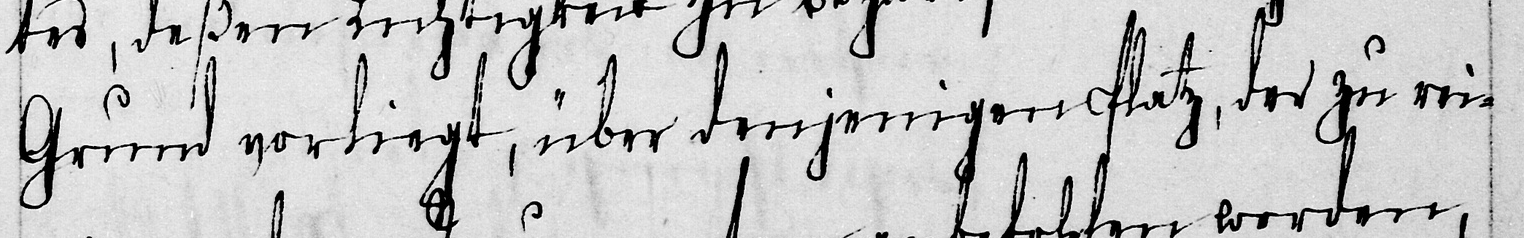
Grund vorliegt, über denjenigen Platz, der zu rei¬
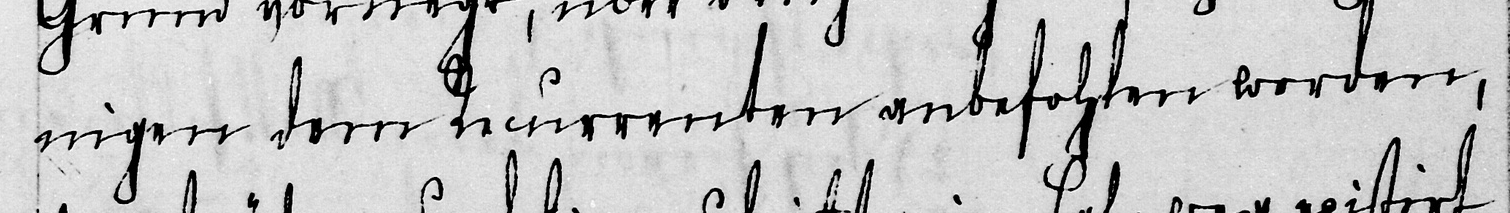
nigen dem Recurrenten anbefohlen worden,
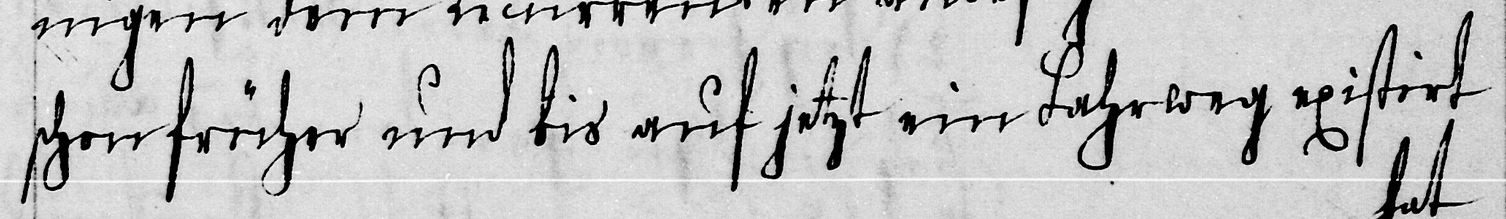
schon früher und bis auf jetzt ein Fahrweg existirt
